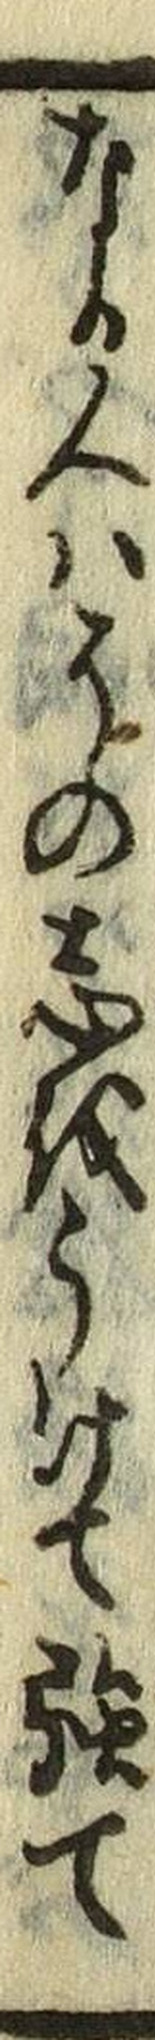なる人はその志をうけて強て
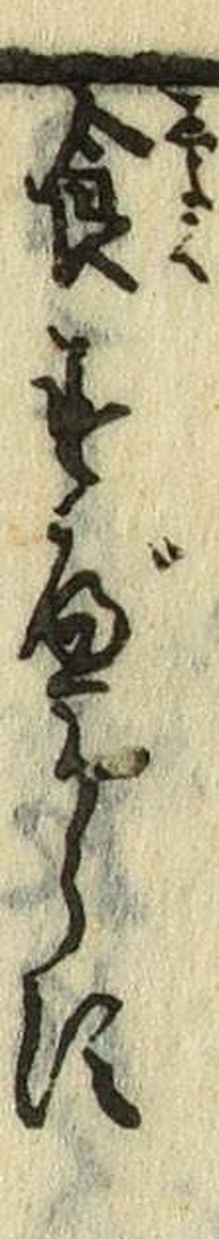食すべからす
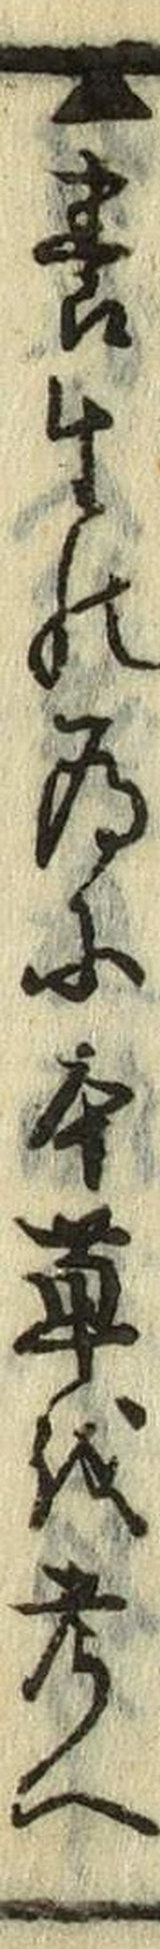▲養生の為に本草を考へ
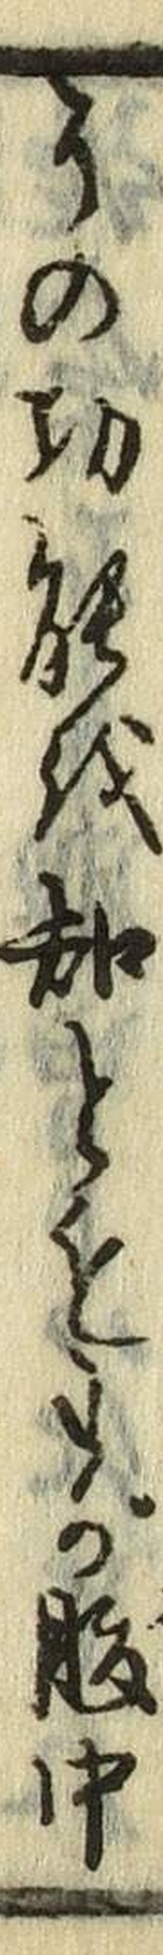その功能を知ともの腹中
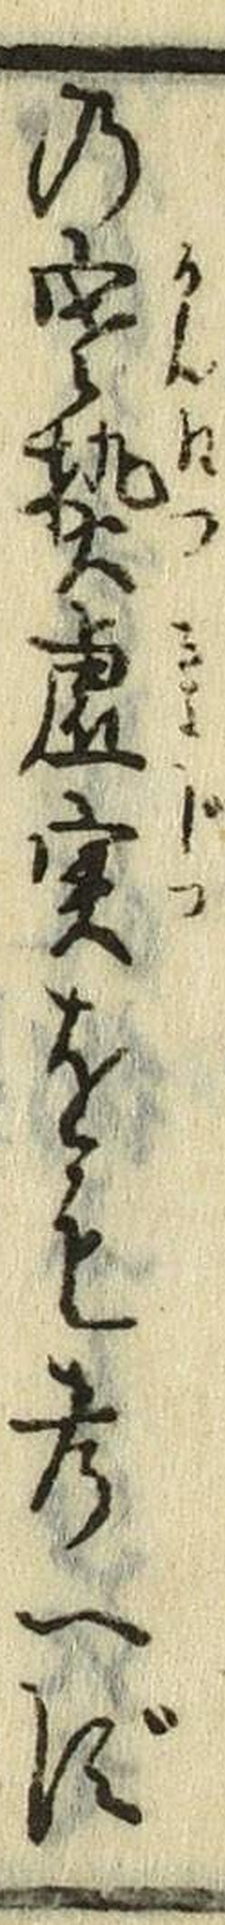の寒熱虚実をも考へず
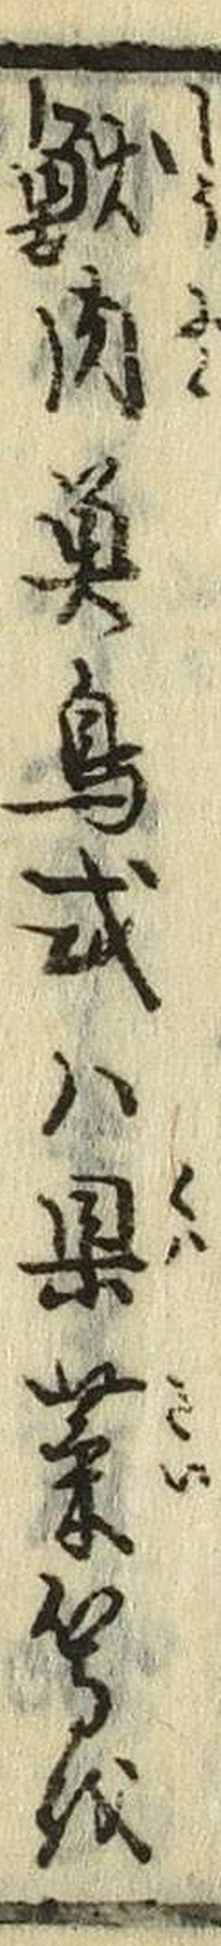獣肉魚鳥或は果菜等を
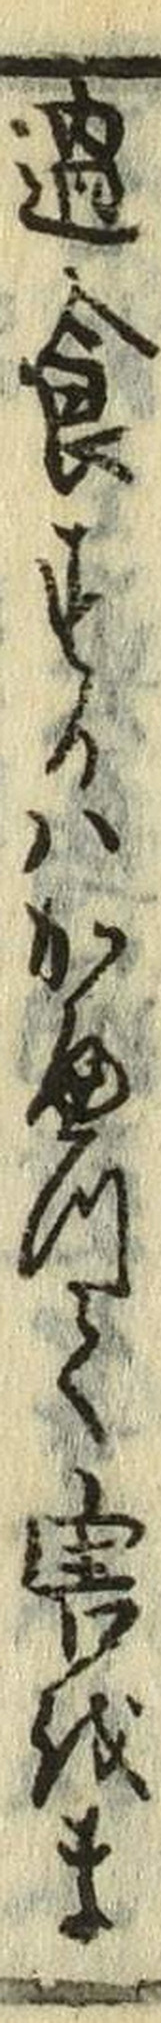過食するはかへつて害をま
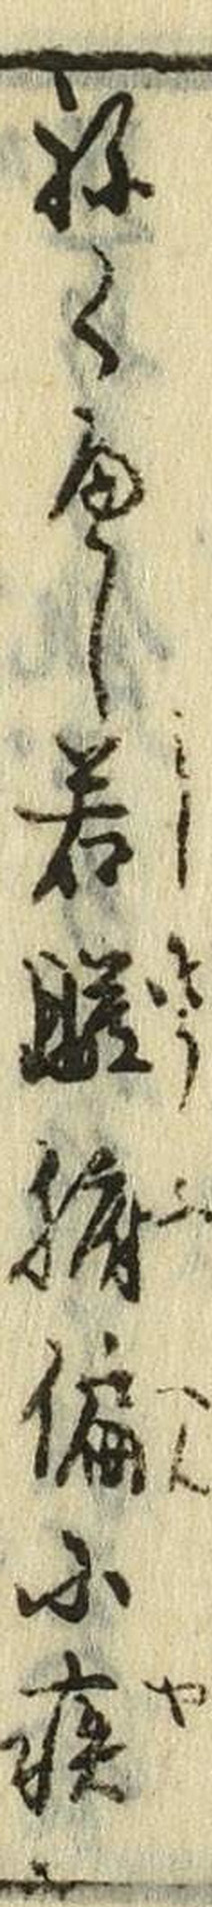ねくへし若臓腑偏に疾
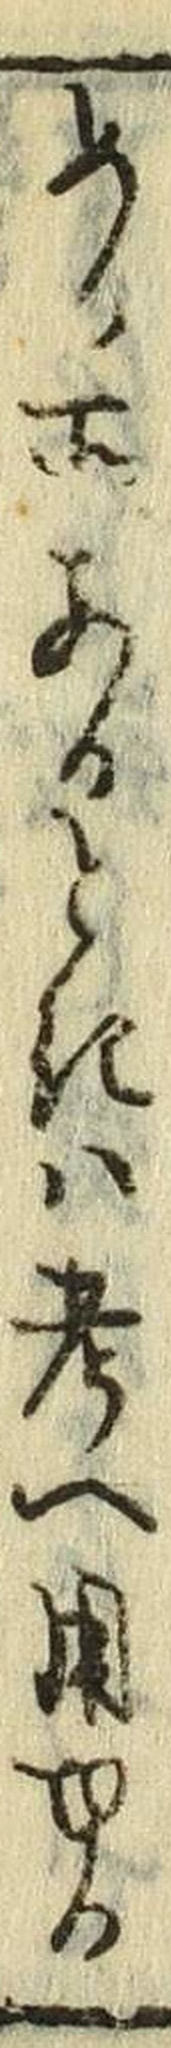める所あるときは考へ用ゆる
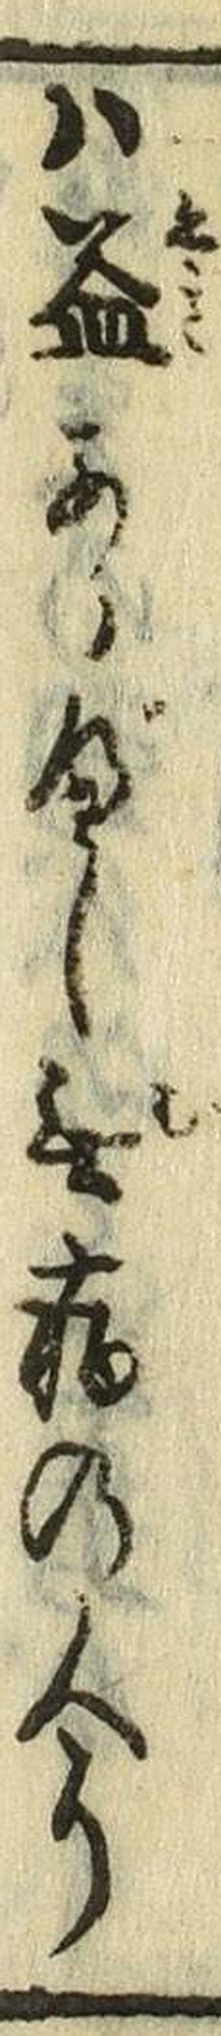は益あるべし無病の人そ
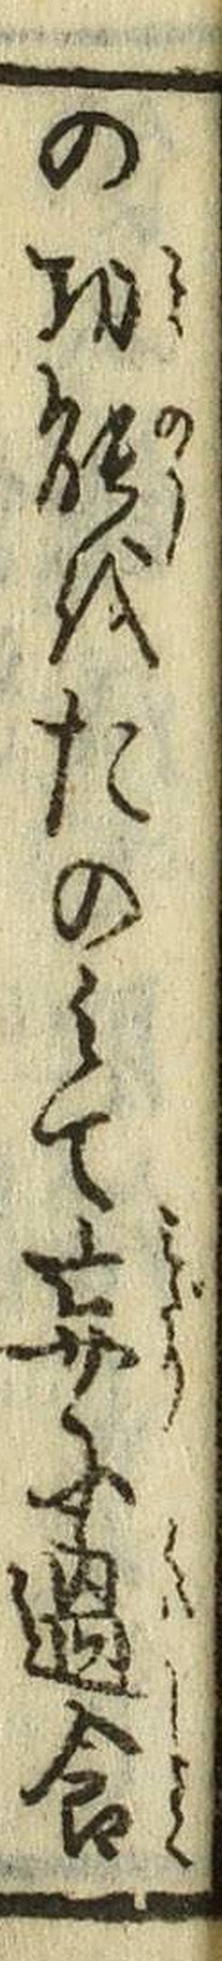の功能をたのみて妄に過食
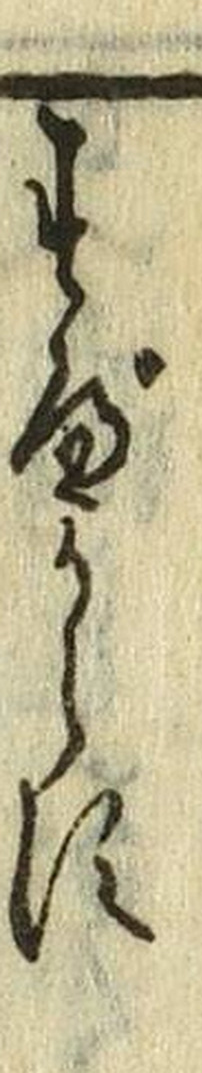すべからす
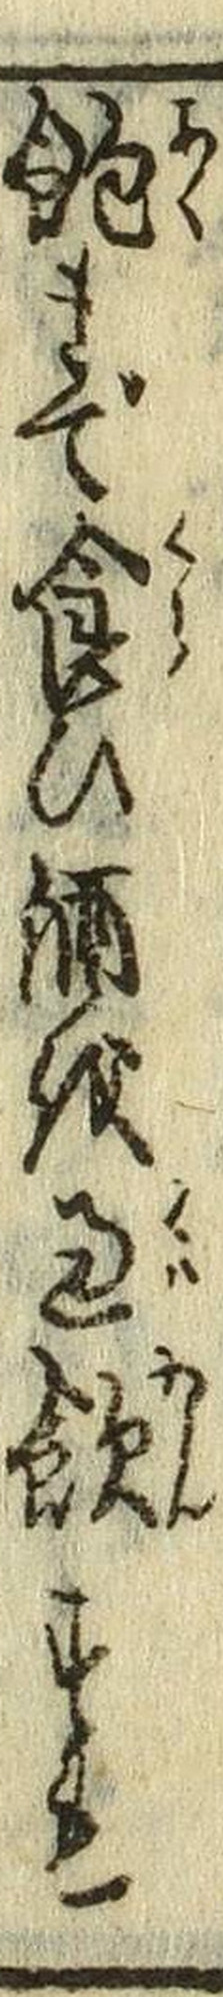飽まで食ひ酒を過飲すれ
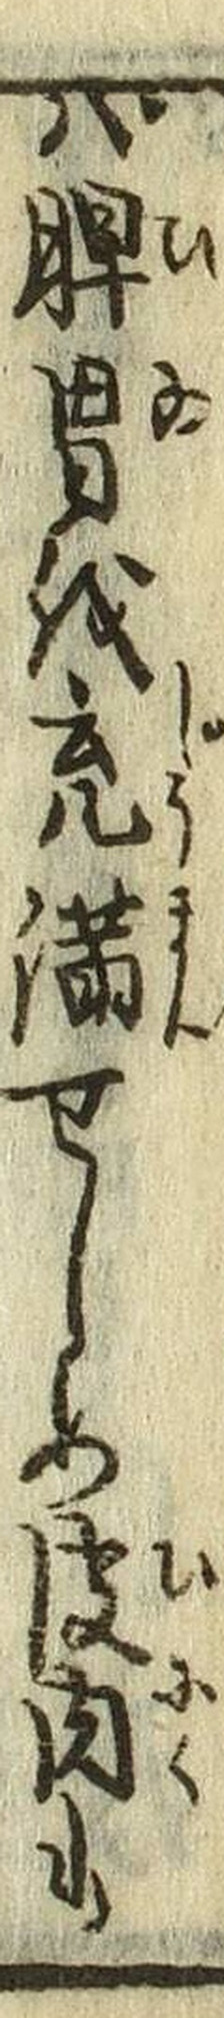ば脾胃を充満せしめ皮肉も
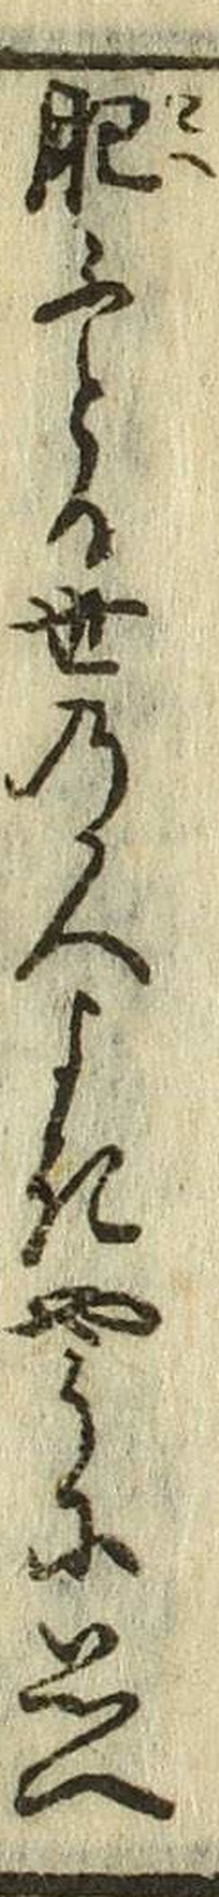肥ふとる世の人よきやうに思へ
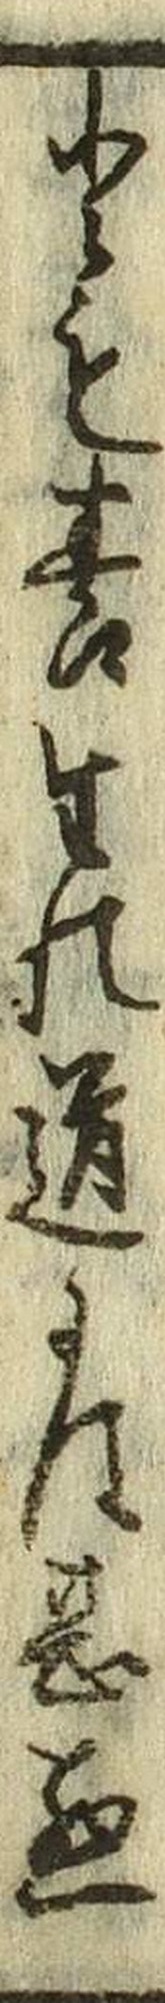とも養生の道には甚悪
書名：居家養生記
